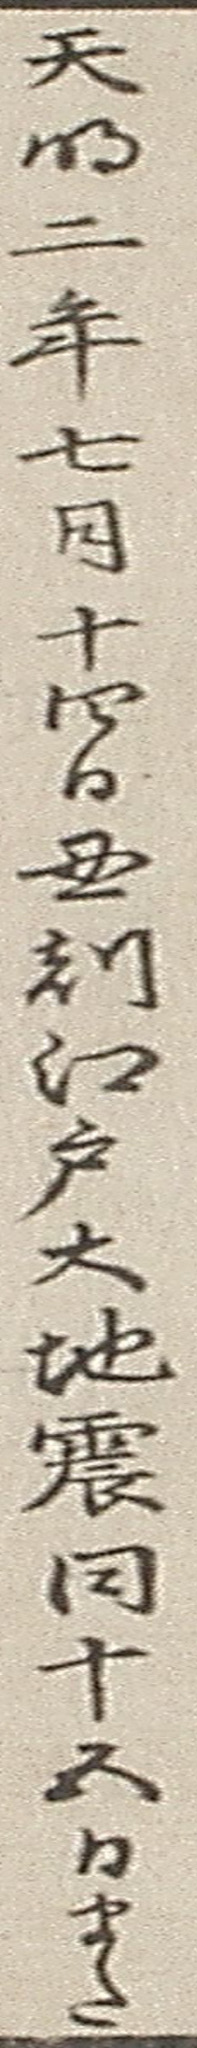天明二年七月十四日丑刻江戸大地震同十五日また
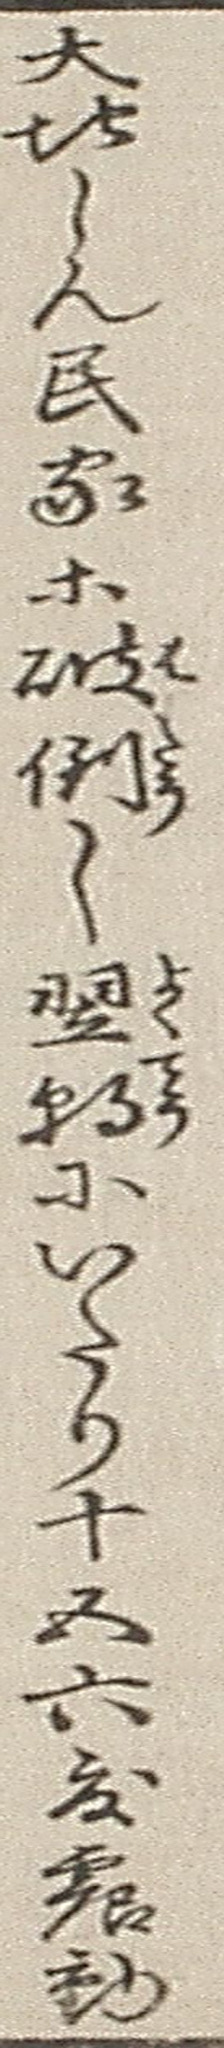大地しん民家等破倒し翌朝にいたり十五六度震動
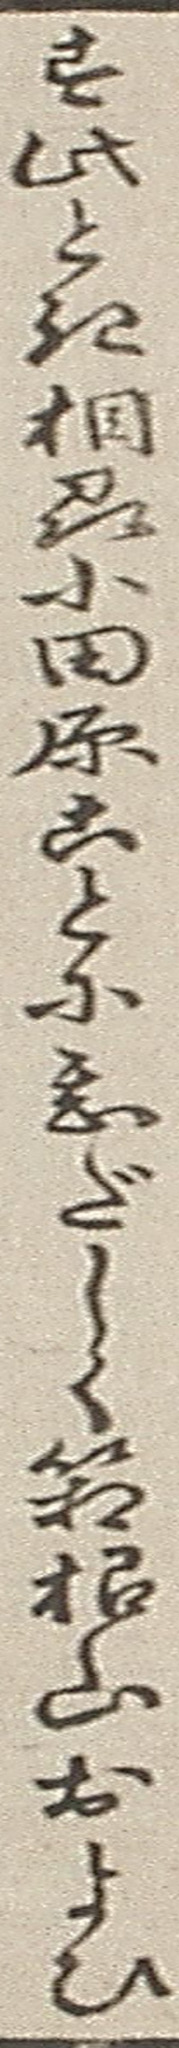す此とき相州小田原ことに甚だしく箱根山およひ
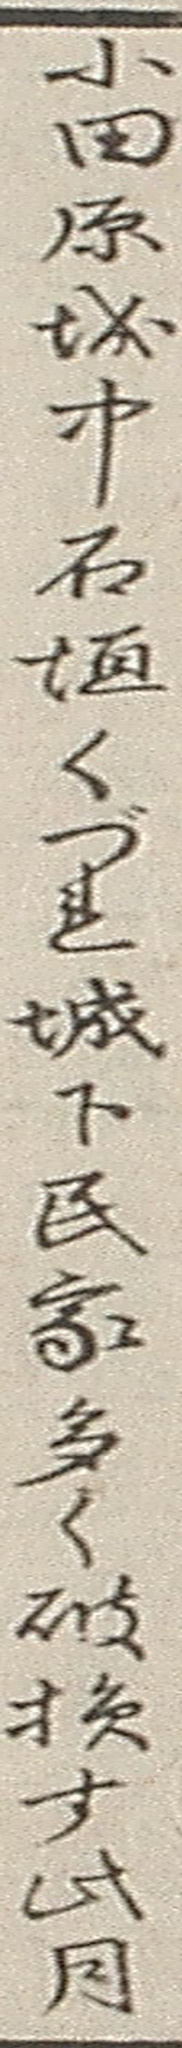小田原城中石垣くづれ城下民家多く破損す此月
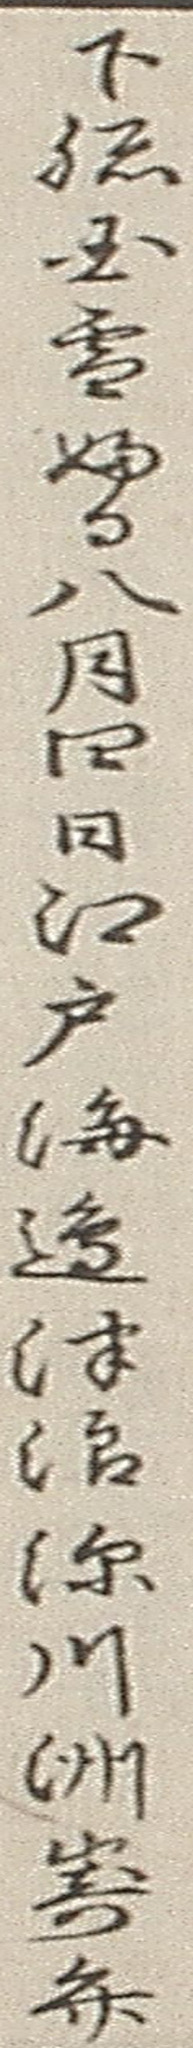下総国雪ふる八月四日江戸海辺津浪深川洲崎弁
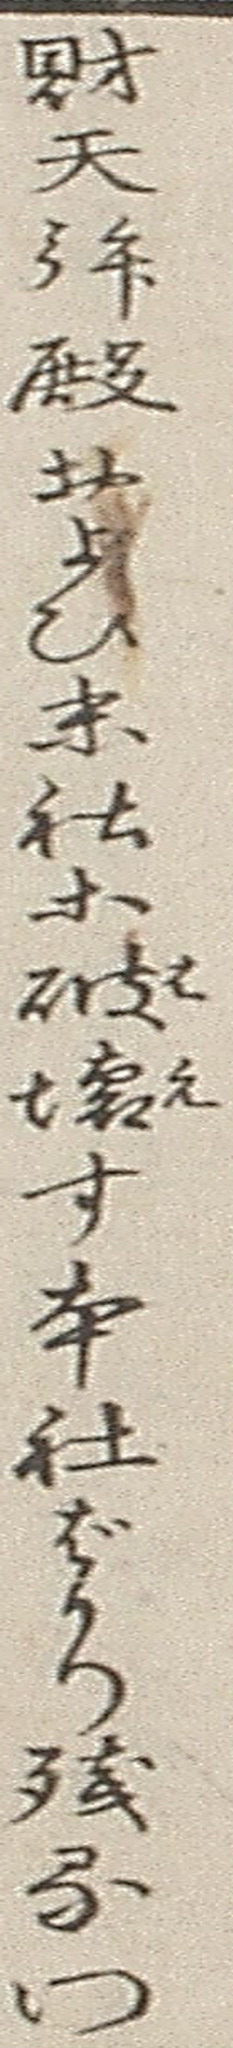財天拝殿およひ末社等破壊す本社ばかり残る門
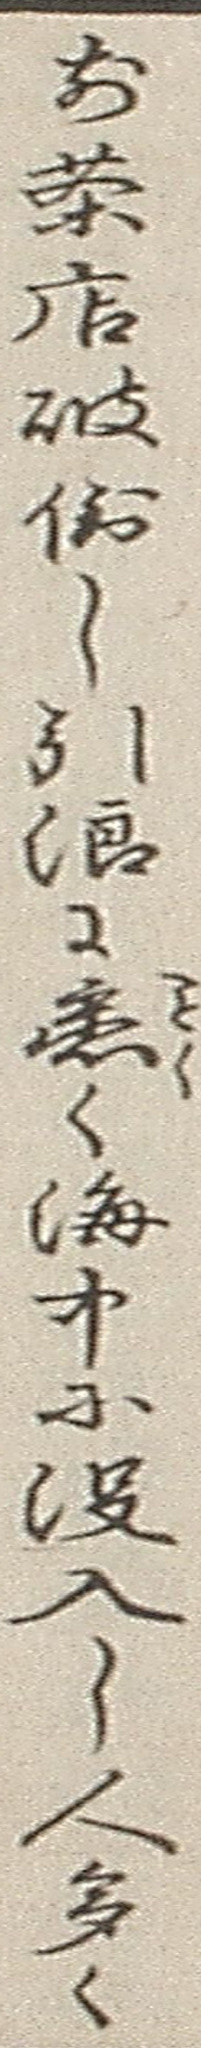前茶店破倒し引浪に悉く海中に没入し人多く
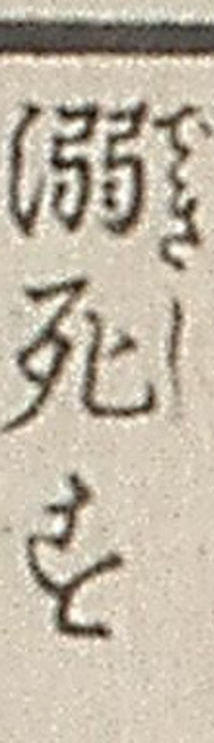溺死す
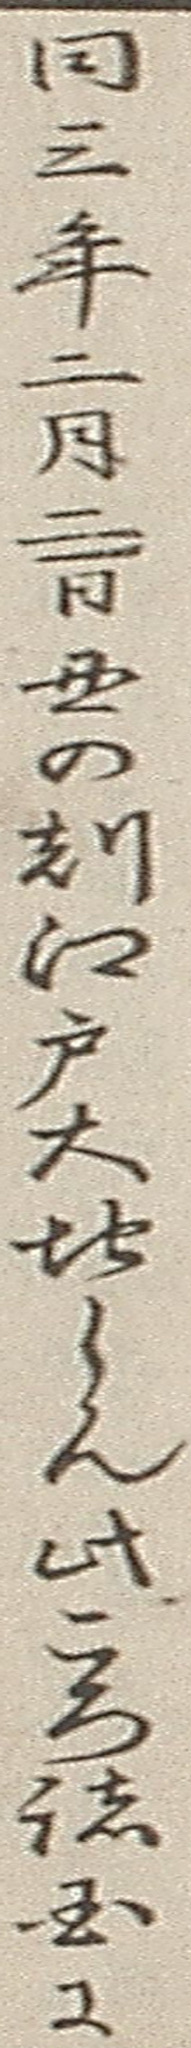同三年二月二？日丑の刻江戸大地しん此ころ諸国に

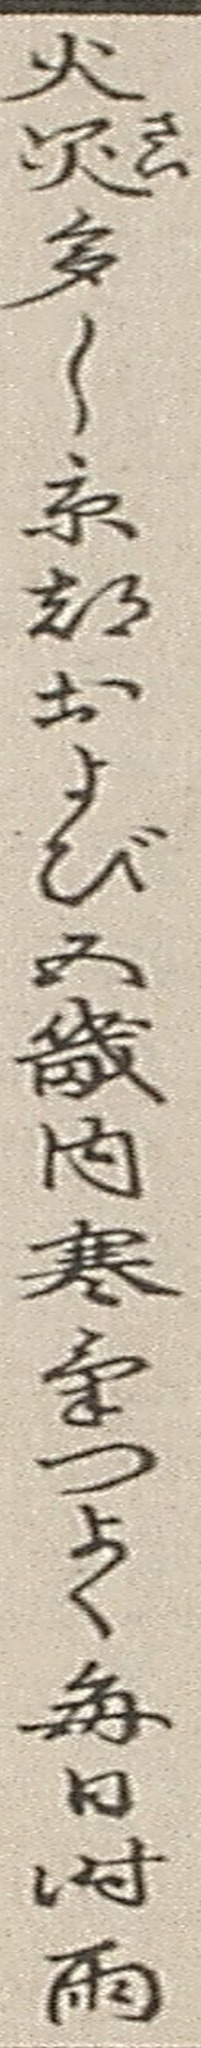火災多し京都および五畿内寒気つよく毎日時雨
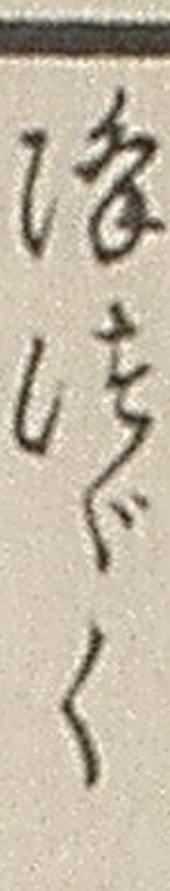降つゞく
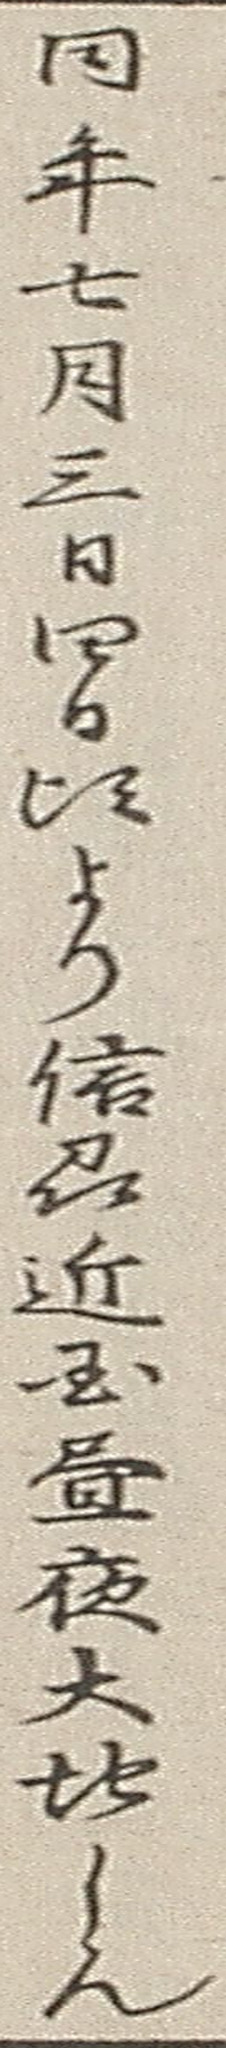同年七月三日四日頃より信州近国昼夜大地しん
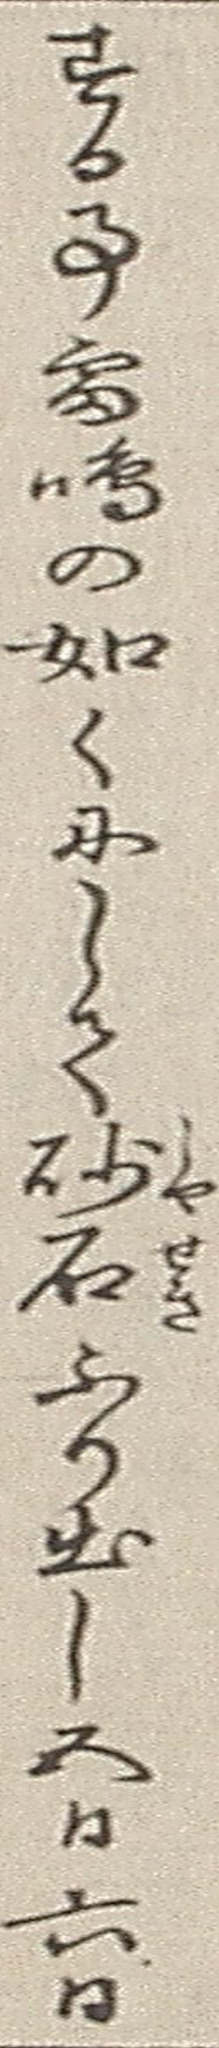する事雷鳴の如くにして砂石ふり出し五日六日
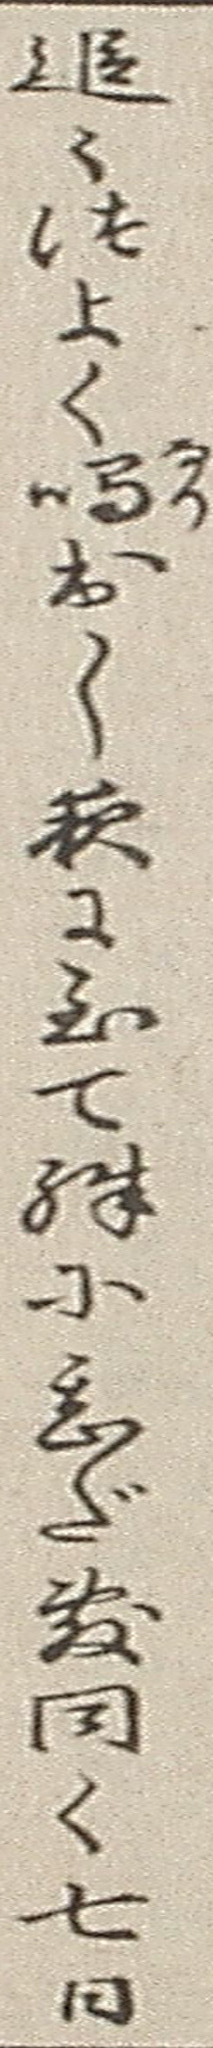追々つよく鳴出し夜に至て殊に甚だ敷同く七日
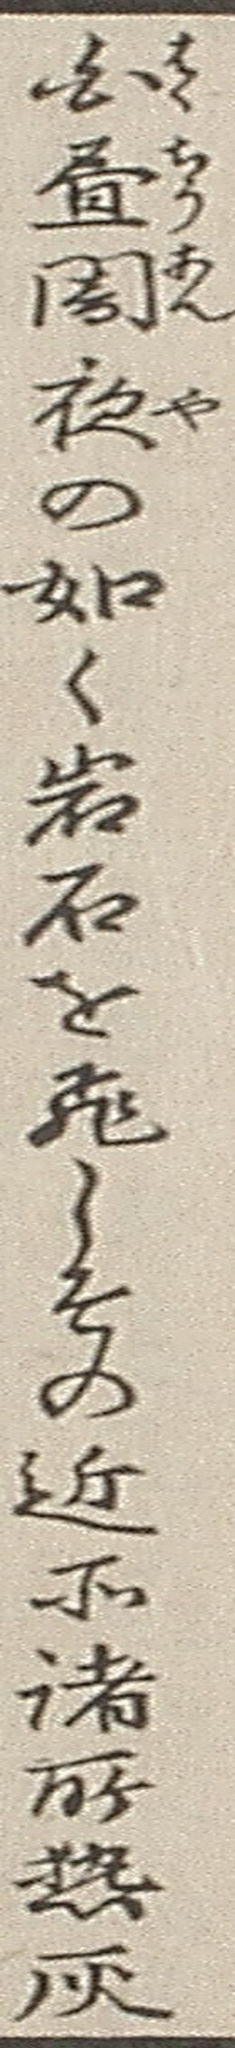白昼闇夜の如く岩石を飛しその近所諸所熱灰
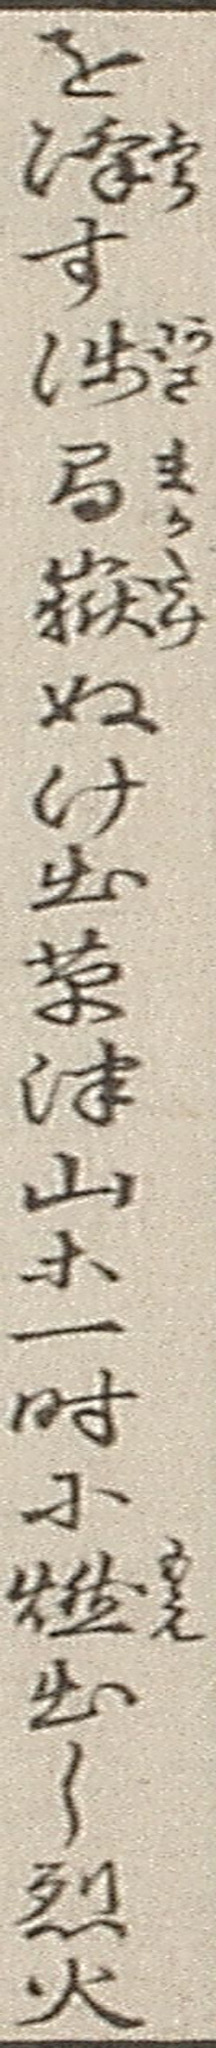を降す浅間嶽ぬけ出草津山等一時に燃出し烈火
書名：大地震暦年考　全
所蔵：東京大学地震研究所図書室 Earthquake Research Institute Library, The University of Tokyo, JAPAN
